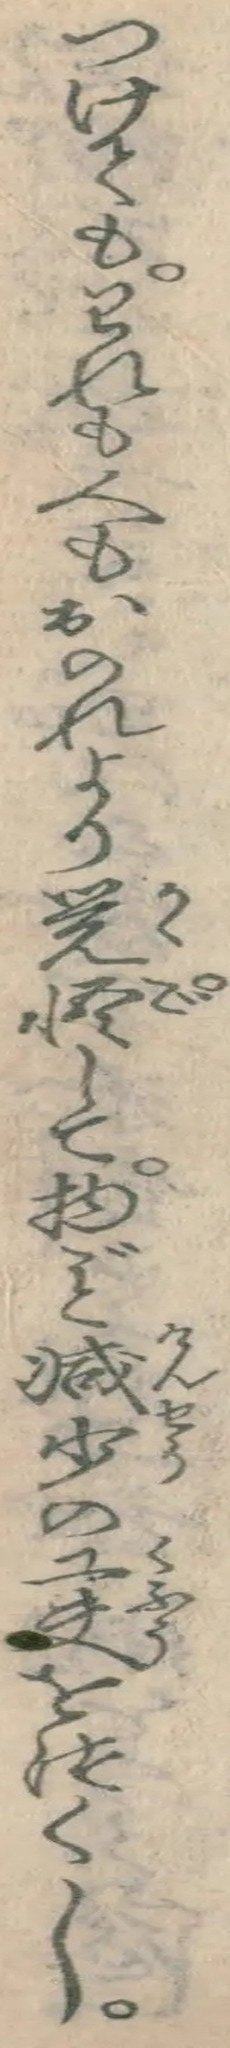つけても。われも人もおのれより覚悟して。物ごと減少の工夫をつくし。

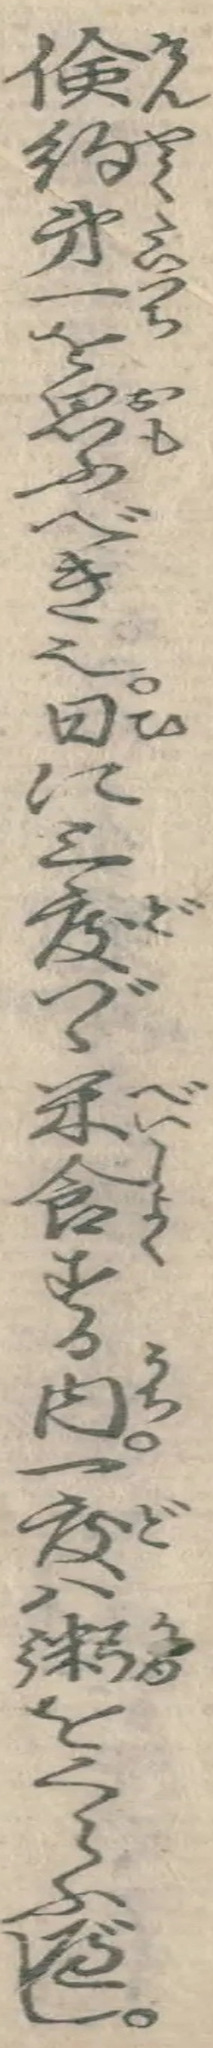倹約第一を思ふべき也。日に三度づゝ米食する内。一度は粥をくらふべし。
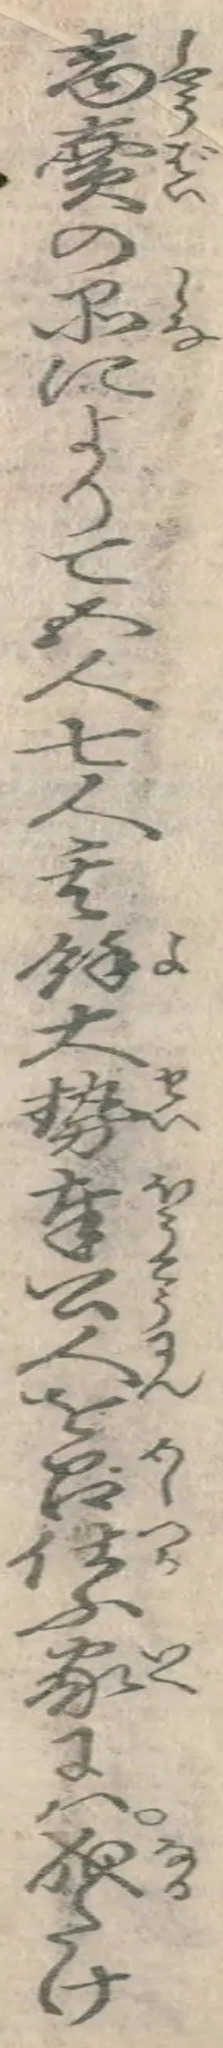商売の品によりて五人七人其余大勢奉公人を召仕ふ家には。成たけ
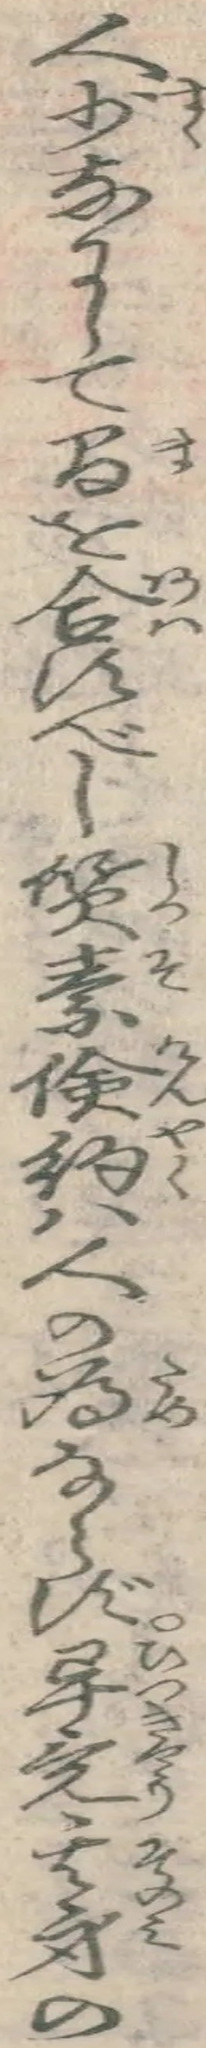人少なにして間を合すべし質素倹約は人の為ならず。畢竟其身の
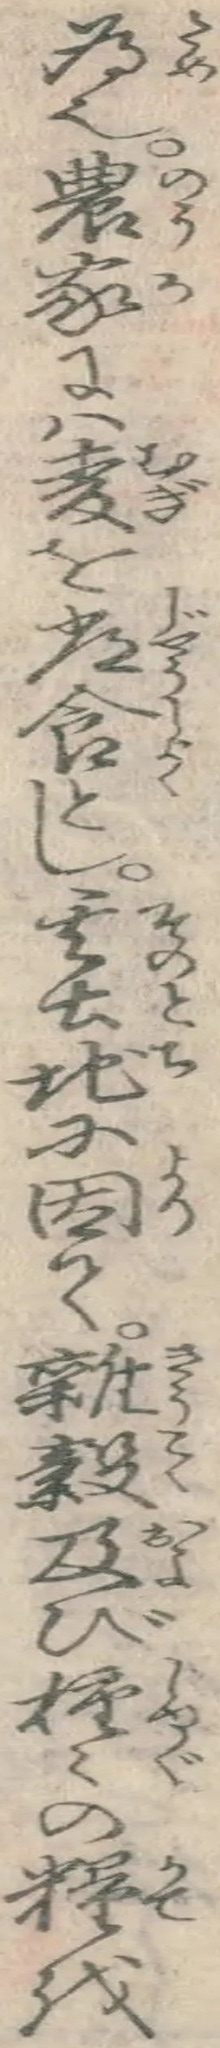為也。農家には麦を常食とし。其土地に因て。雑穀及び種々の糧を
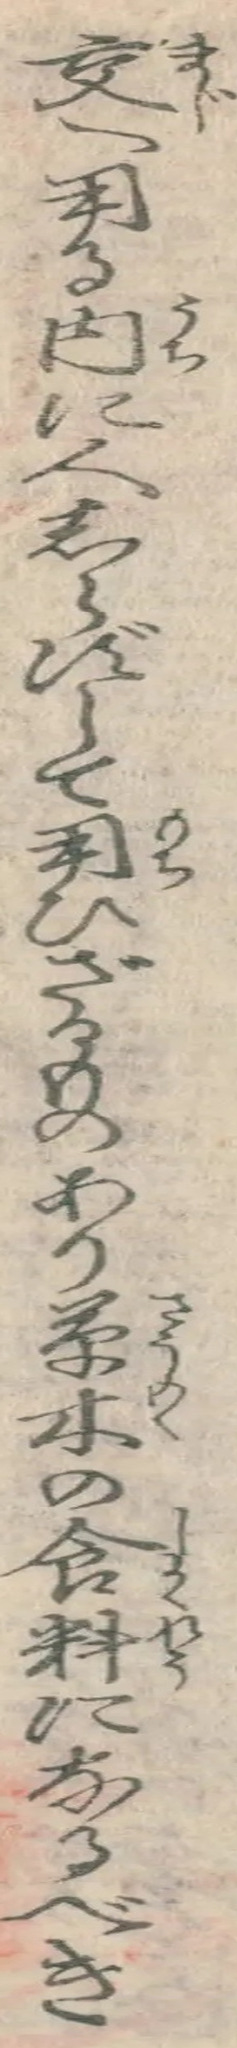交へ用る内に人しらずして用ひざるものあり草木の食料になるべき
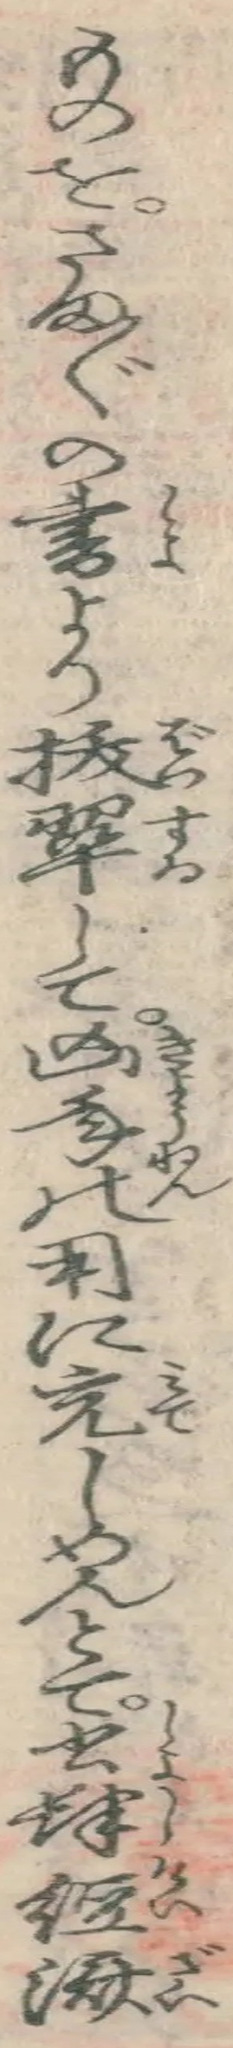ものを。さま〴〵の書より抜翠して。凶年の用に充しめんとて。書肆経済
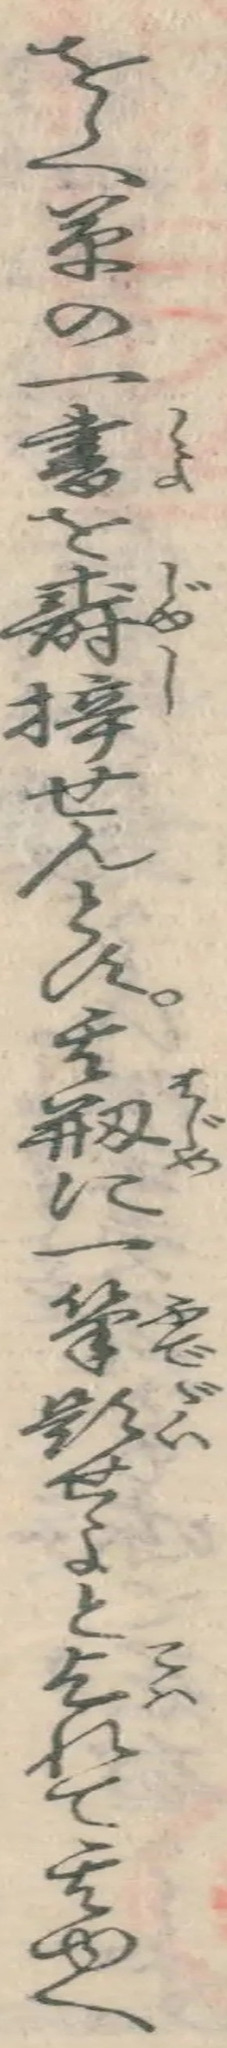をしへ草の一書を寿梓せんとす。其剏に一筆題せよと乞れて其ゆへ
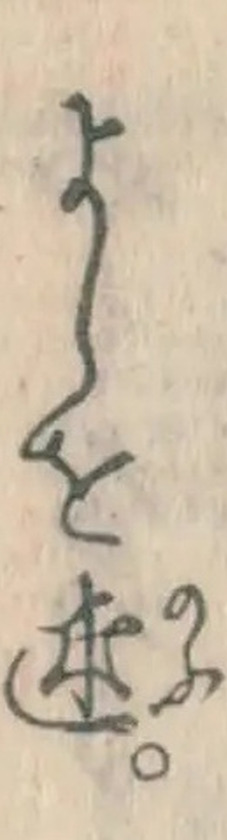よしを述。
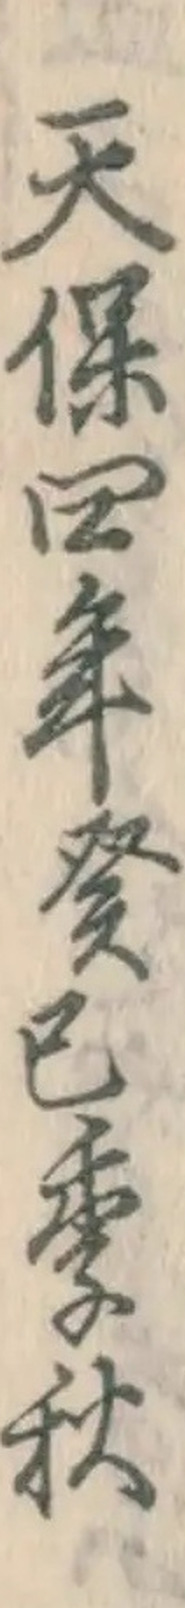天保四年癸巳季秋
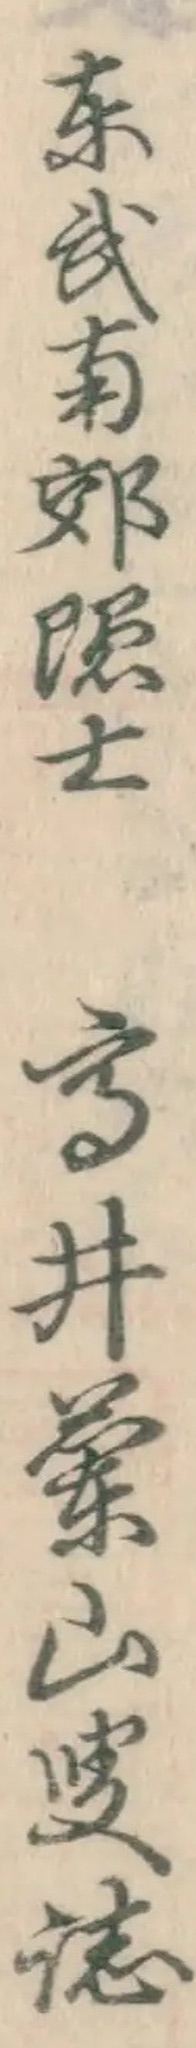東武南郊隠士高井蘭山叟誌
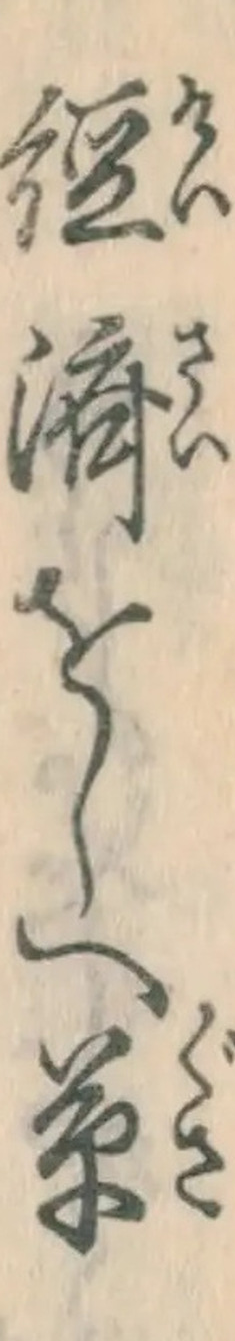経済をしへ草
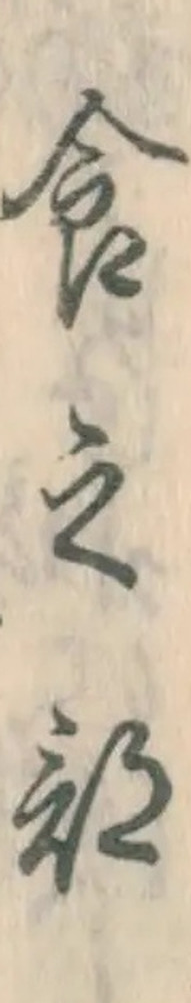食之部
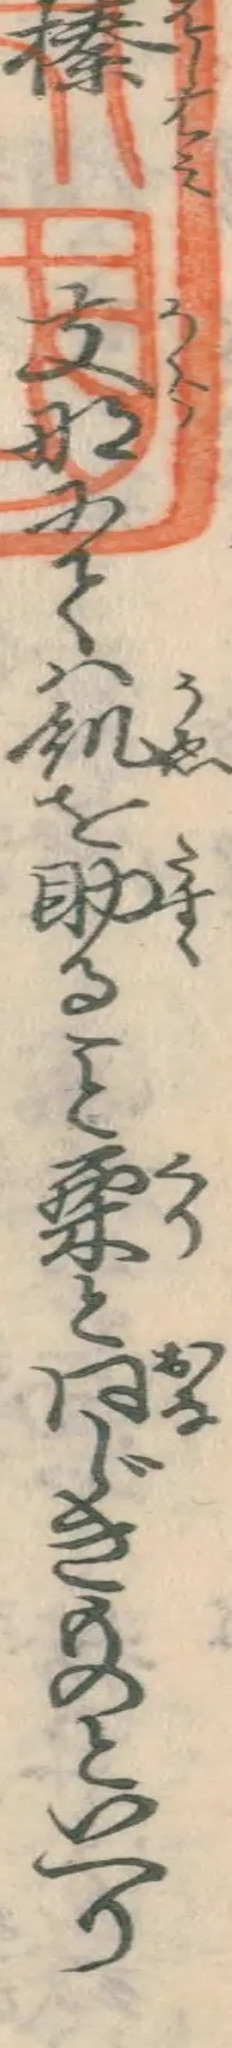榛支那にては飢を助ること栗と同じきものといへり
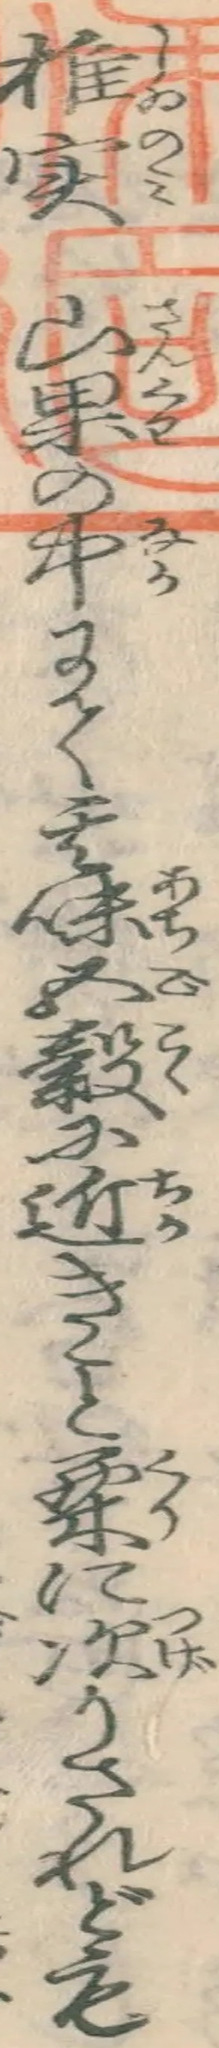椎実山菓の中にて其味五穀に近きこと栗に次りされども
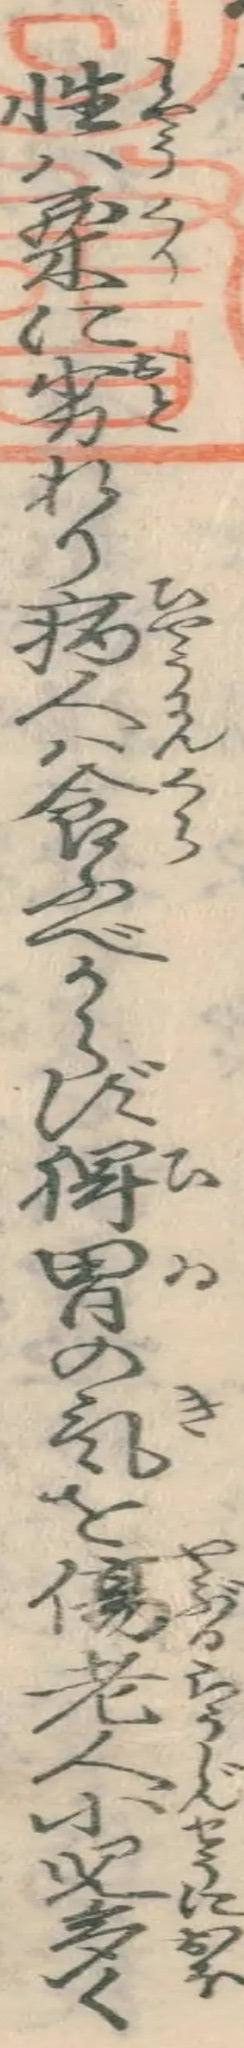性は栗に劣れり病人は食ふべからず腗胃の気を傷老人小児多く
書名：経済をしへ草
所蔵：国立国会図書館 National Diet Library, JAPAN
